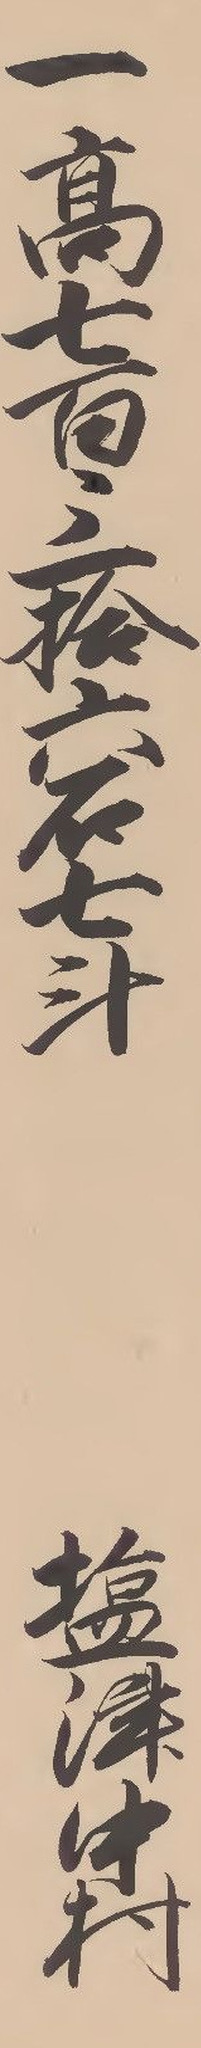一高七百三拾六石七斗塩津中村
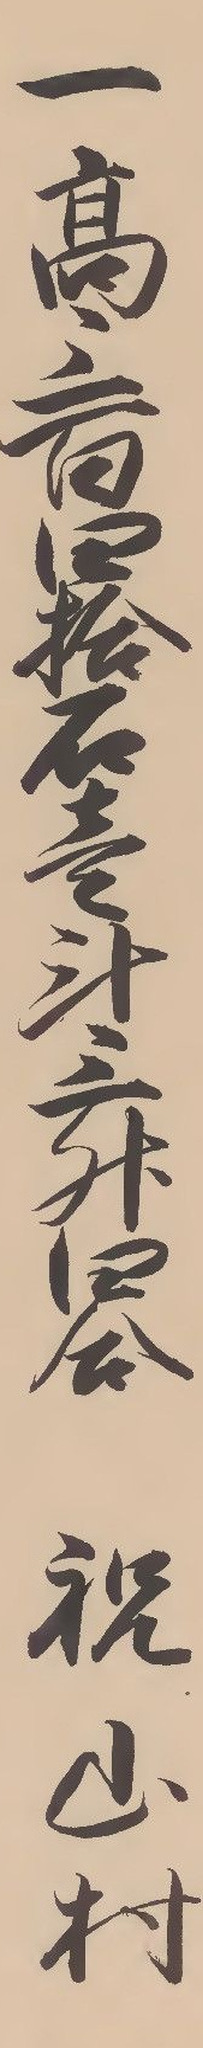一高三百四拾石壱斗三升四合祝山村
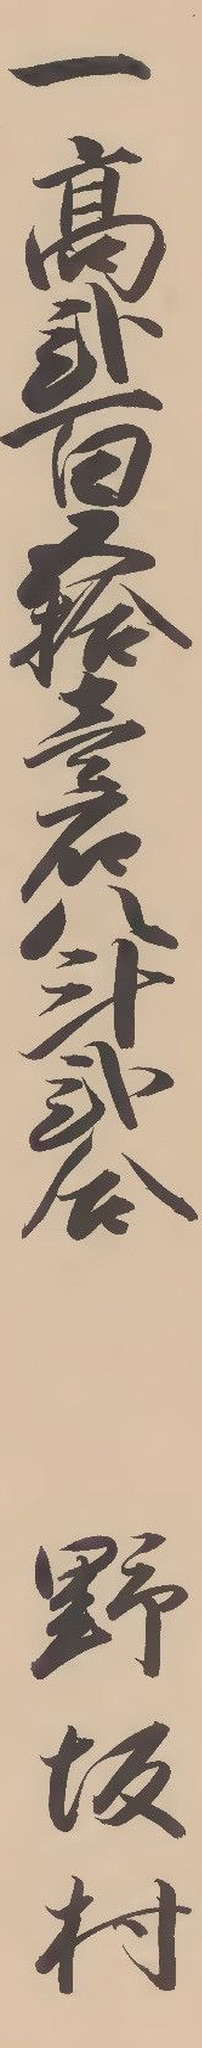一高弐百五拾壱石八斗弐合野坂村
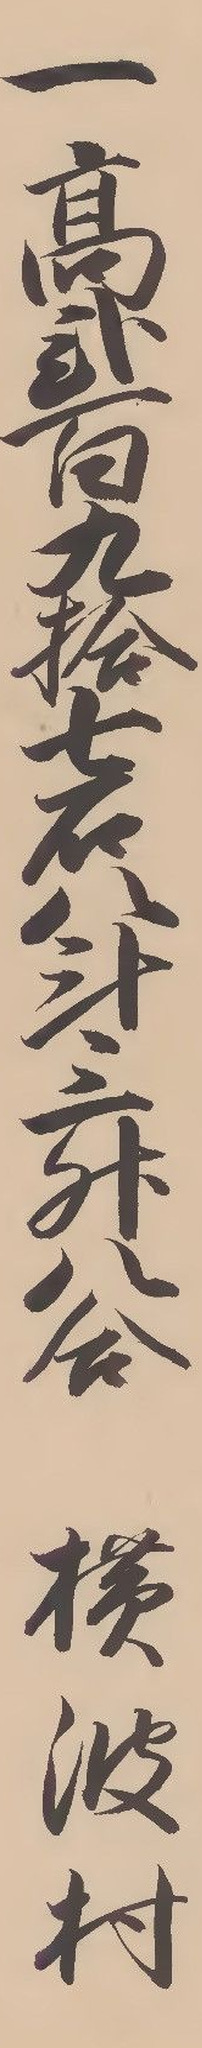一高弐百九拾七石八斗三升八合横波村

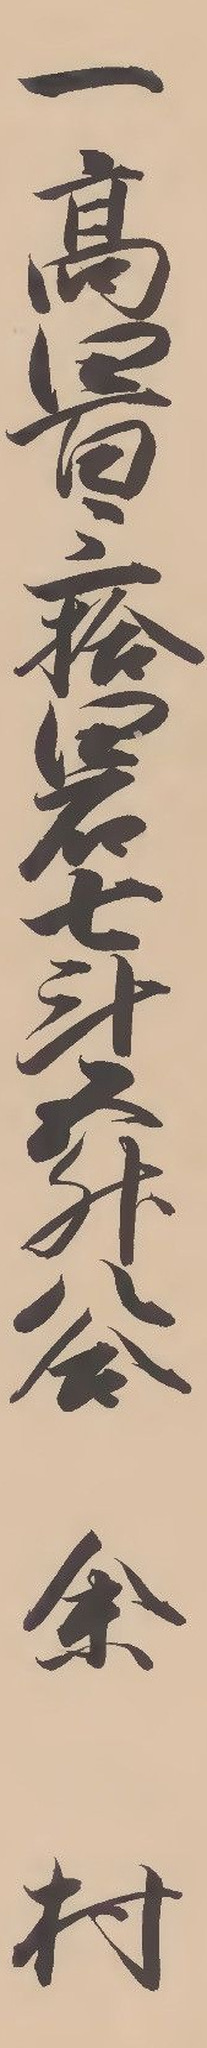一高四百三拾四石七斗五升八合余村
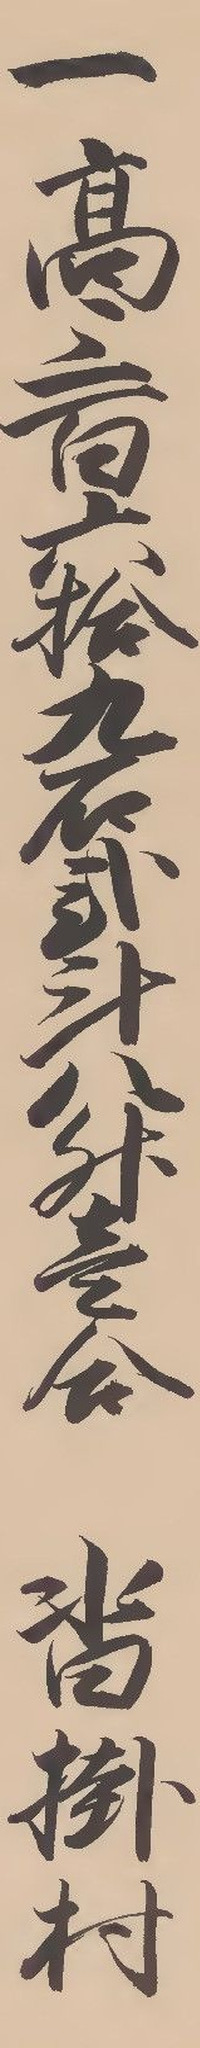一高三百六拾九石弐斗八升壱合沓掛村
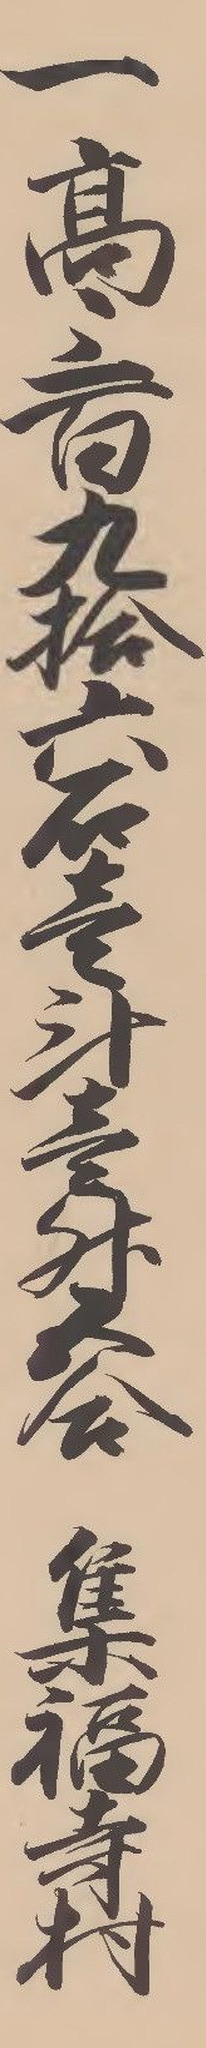一高三百九拾六石壱斗壱升五合集福寺村
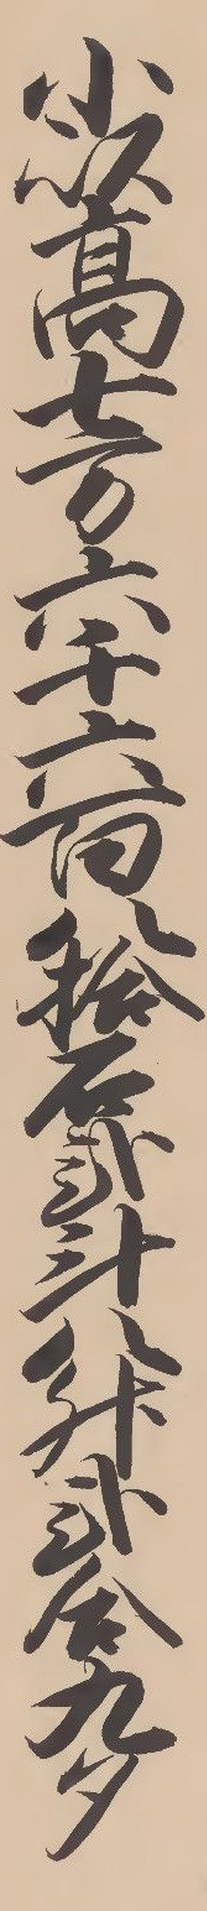小以高七万六千六百八拾石弐斗八升弐合九勺

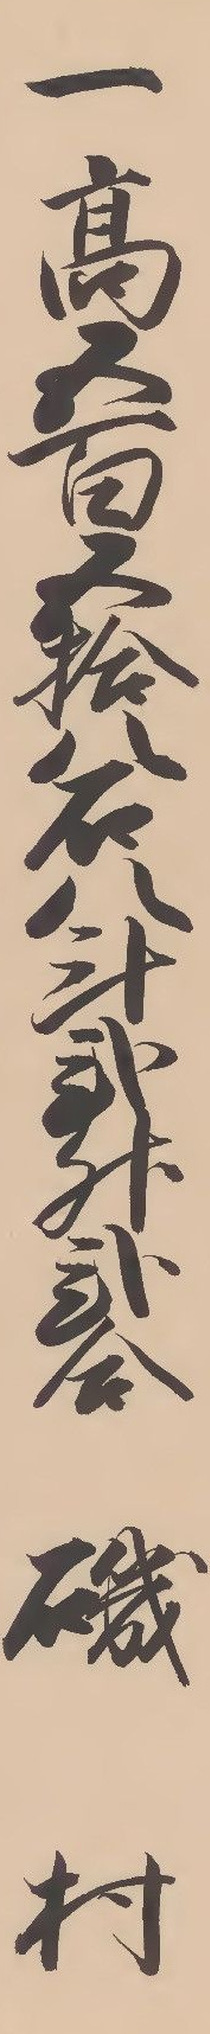一高五百五拾八石八斗弐升弐合磯村
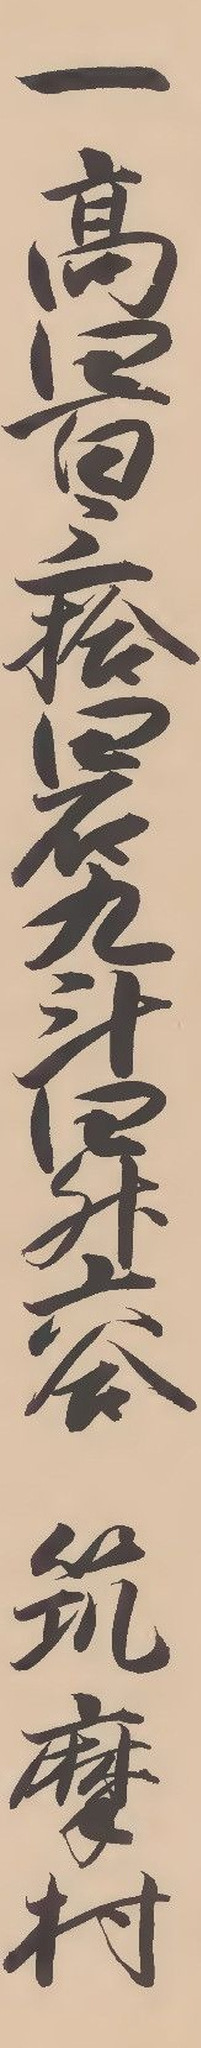一高四百三拾四石九斗四升六合筑摩村
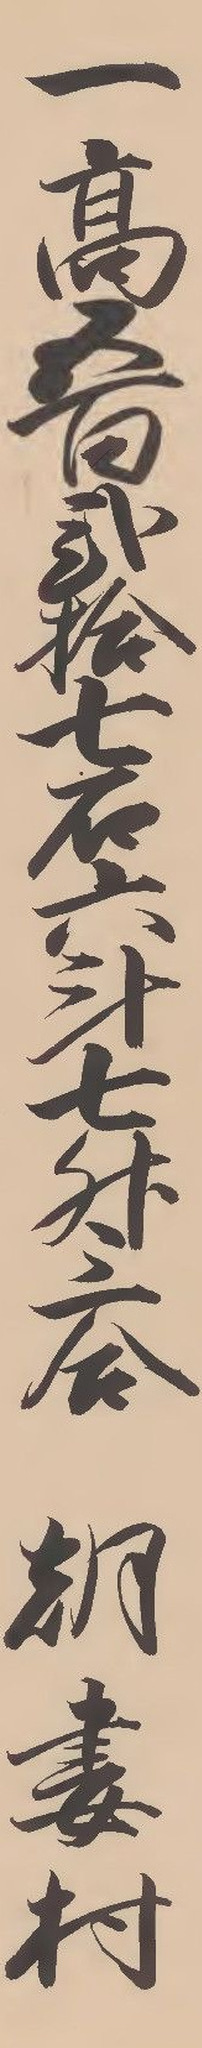一高五百弐拾七石六斗七升三合朝妻村
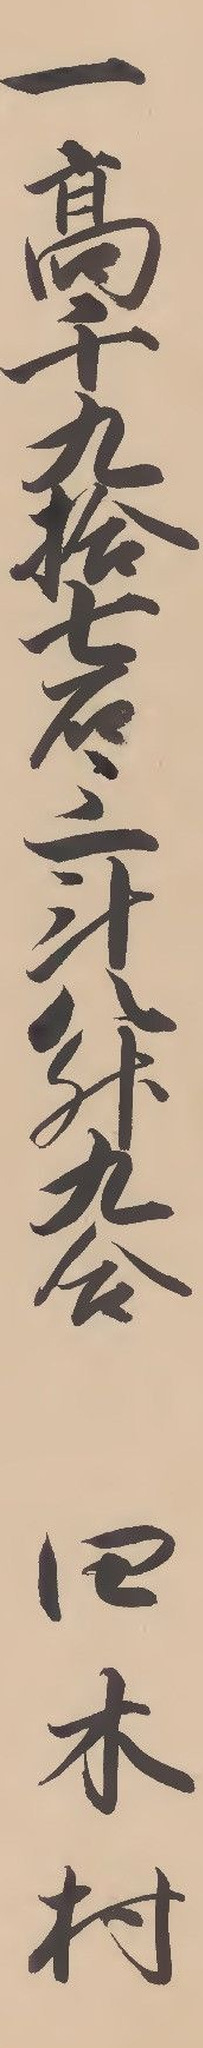一高千九拾七石三斗八升九合四木村
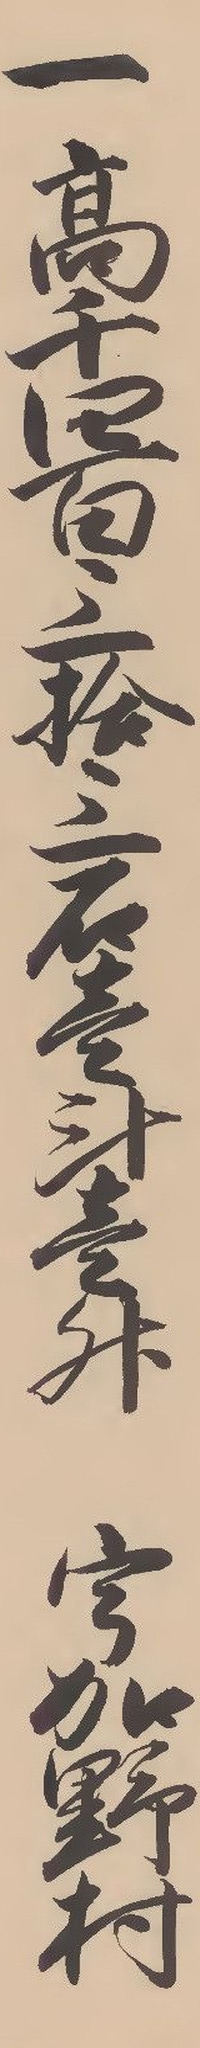一高千四百三拾三石壱斗壱升宇加野村
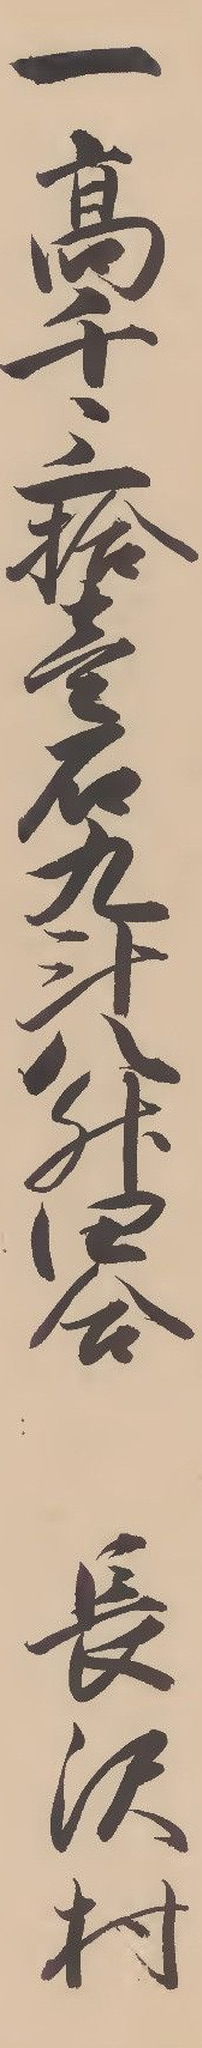一高千三拾壱石九斗八升四合長沢村
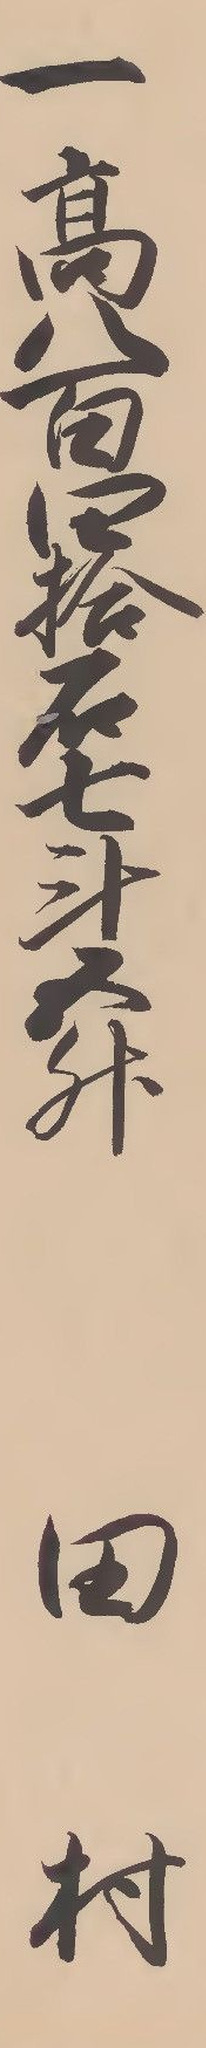一高八百四拾石七斗五升田村

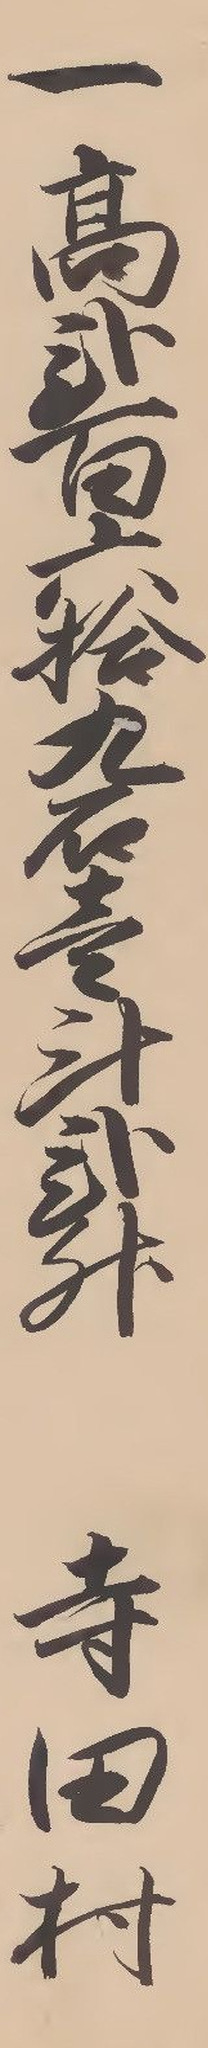一高弐百六拾九石壱斗弐升寺田村
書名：近江国郷帳
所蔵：国立公文書館 National Archives of Japan
